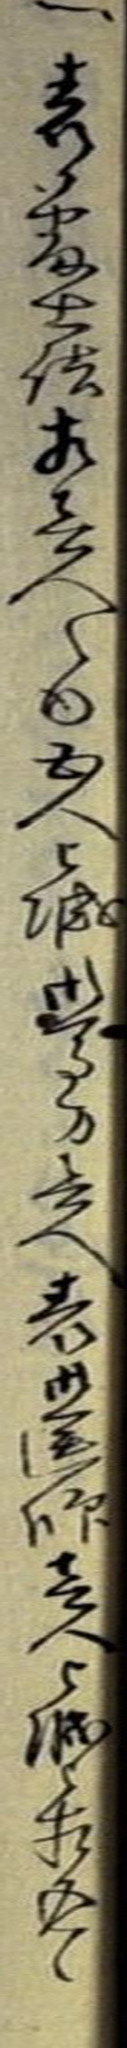一表御番士詰拾壱人之内五人被減御馬方壱人表御医師壱人被減被相返之
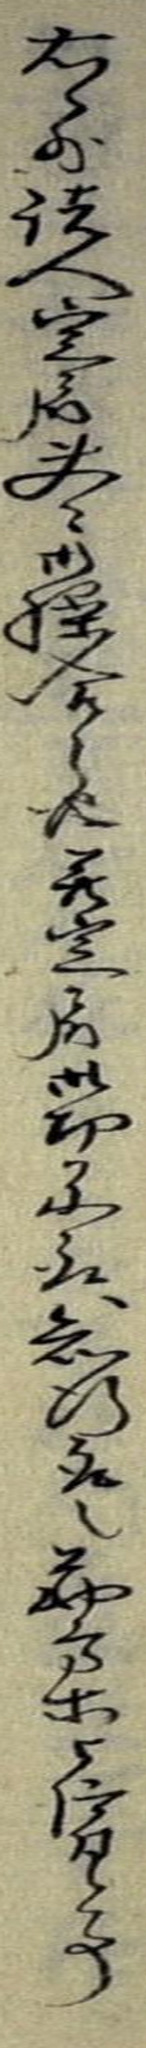右之外詰人定府夫々御繰合之儀并定府御切米取へ知行取之勤方等被仰付候事
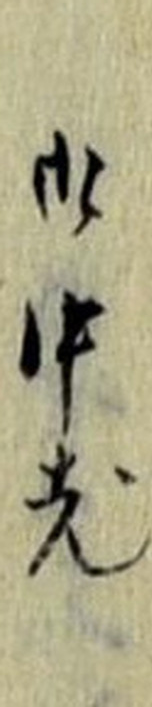御中老
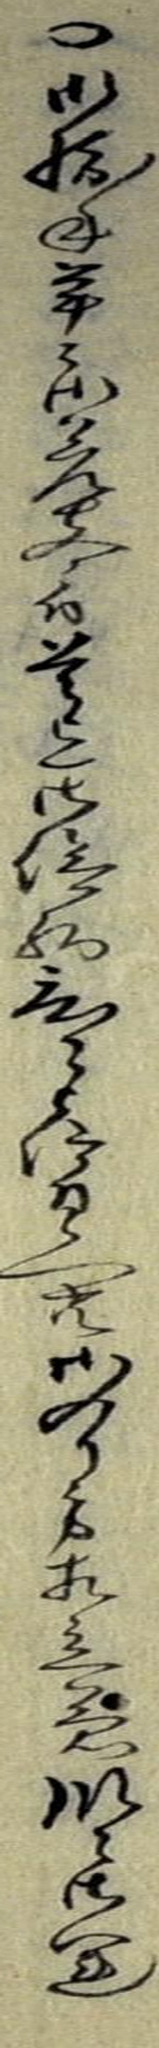〇御勝手年々御差支に付是迄御倹約度々被仰付候へ共御〆り方相立兼段々御運
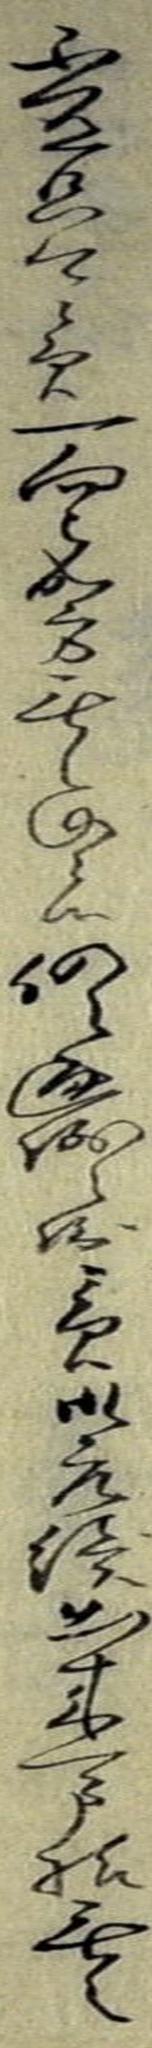不宜只今に而は一向被成方無之趣に候仍之通例之儀に而は御取続出来可申様無之
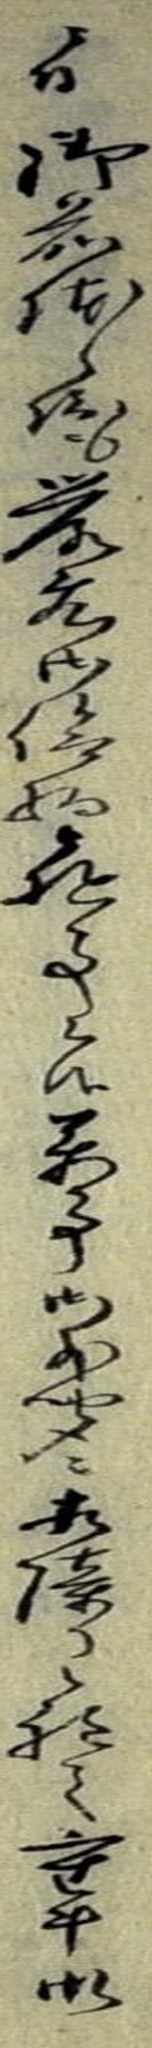に付御前体之儀も厳敷御倹約被遊事に候万事御外聞に相障り候程之重キ御
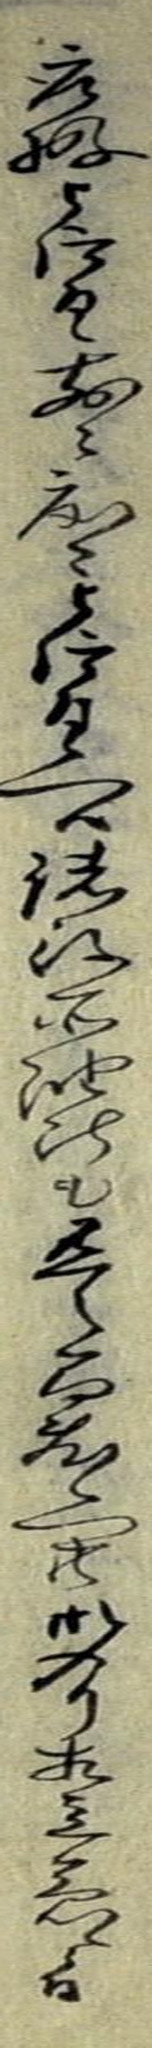取扱被仰付候前々度々被仰付候へは諸役所油断も有之間敷候へ共御〆り相立兼候に付
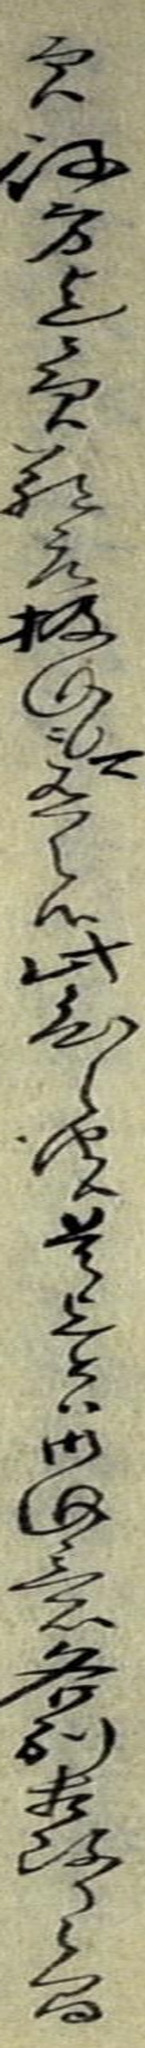而は役方迄に而は難取扱趣も可有之候此度之儀は是迄とは御趣意各別相改り候間
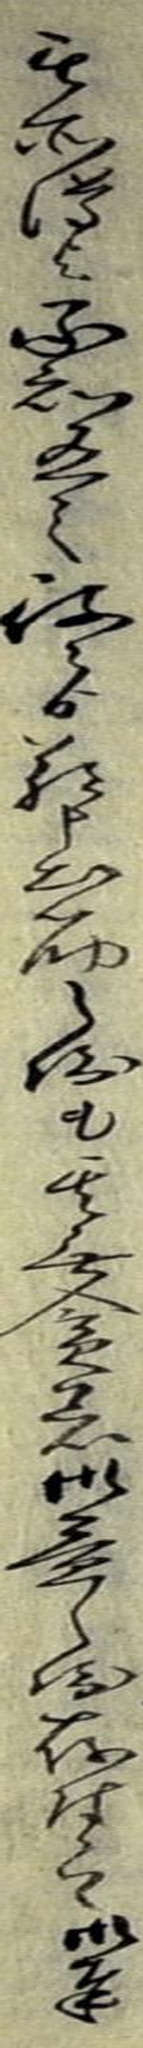其所得与承知有之役々ゟ難申出筋之儀も其無貪着御益之儀存付候はゝ御奉
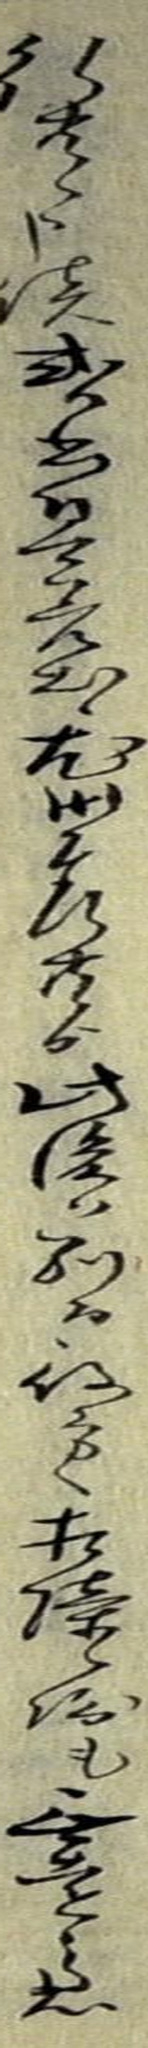行共へ申談或は書付可差出候尤御奉行共ゟ此後は別而役方へ相障候儀も無遠慮
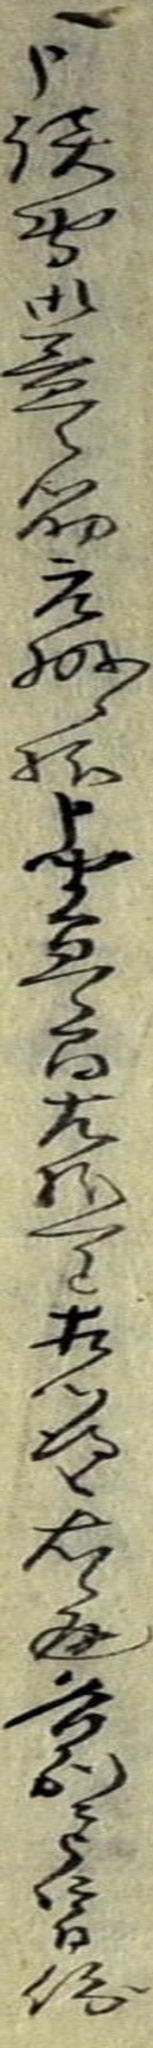申談専御益之筋取扱候様申聞置候間左様可被相心得候右之通各別に被仰付儀
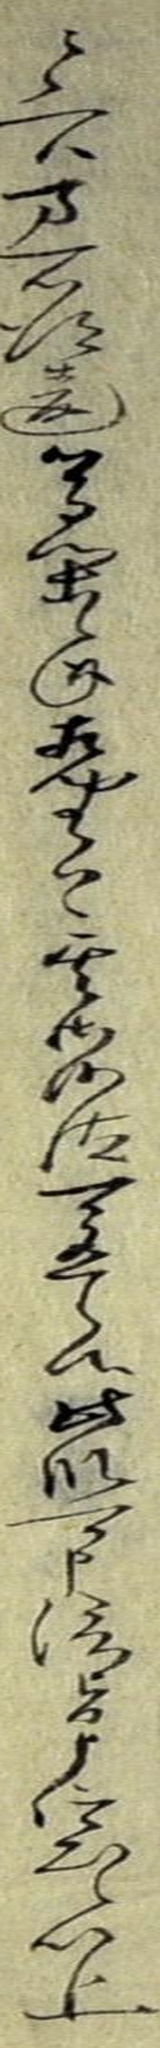に候へは万一心得違等閑候趣相聞候はゝ其御沙汰可有之候此段可申渡旨被仰出候以上
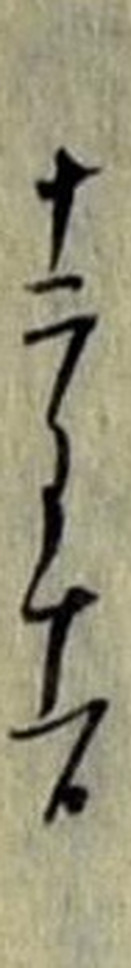十二月十一日

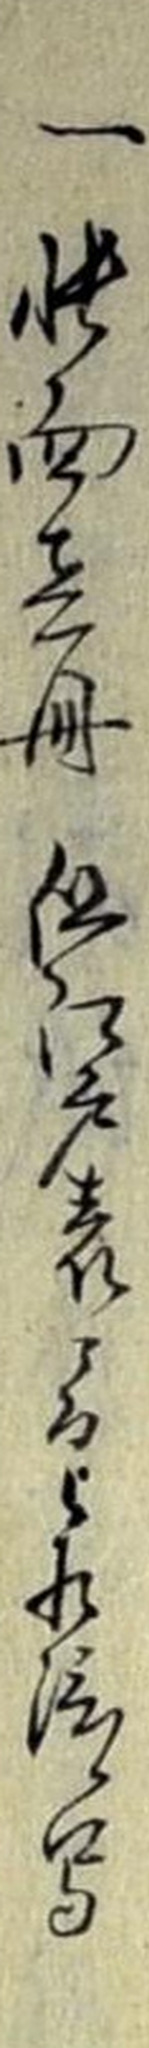一帳面壱冊但江戸表に而被相渡候写
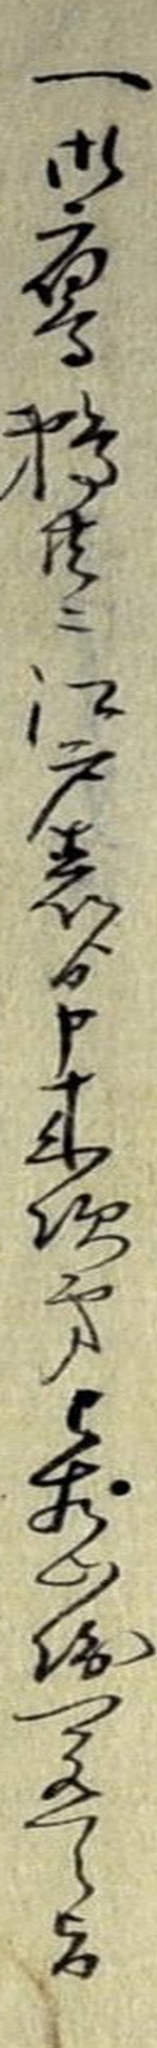一御鷹鵜共に江戸表ゟ申来次第被相止儀可有之旨
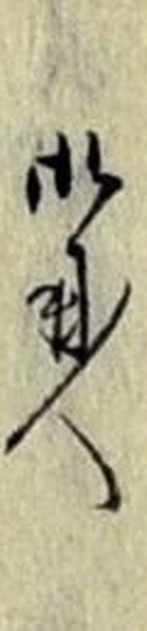御用人
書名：命令之部 二
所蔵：福井県文書館 Fukui Prefectural Archives
